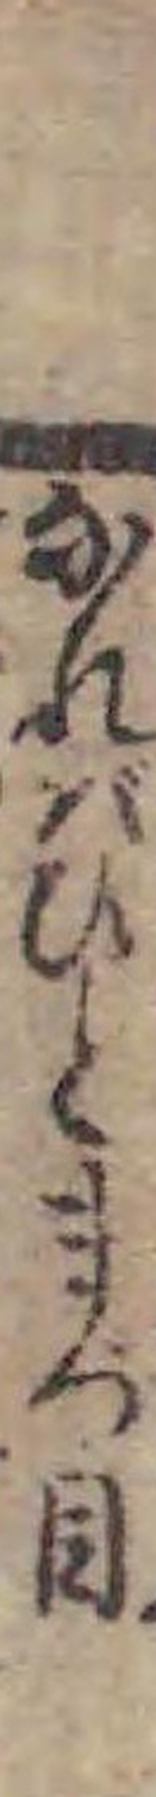なればひとまづ目
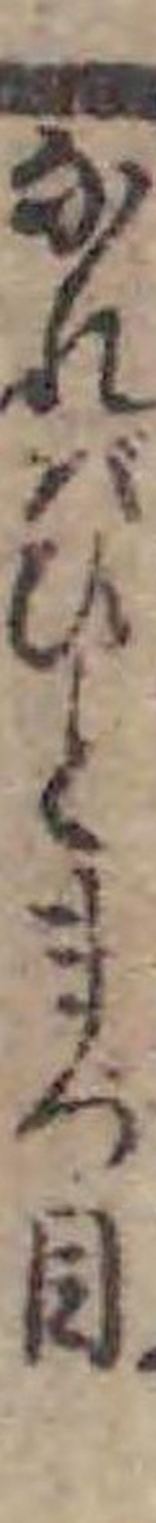なればひとまづ目
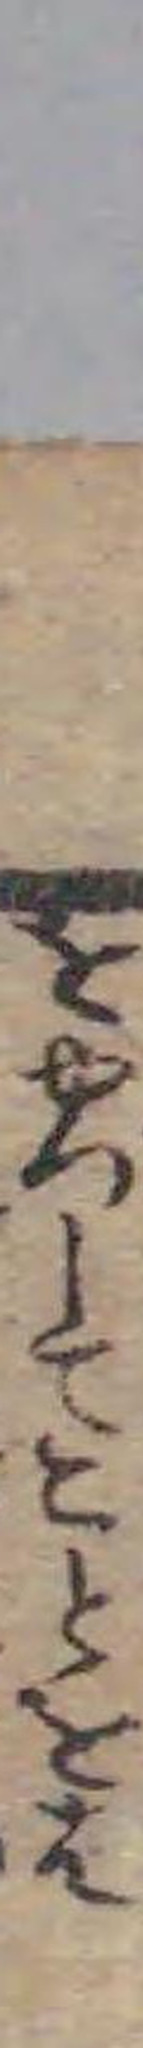をやつしてことをは
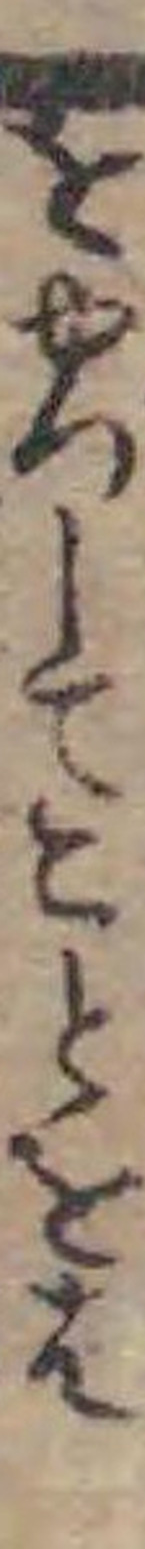をやつしてことをは
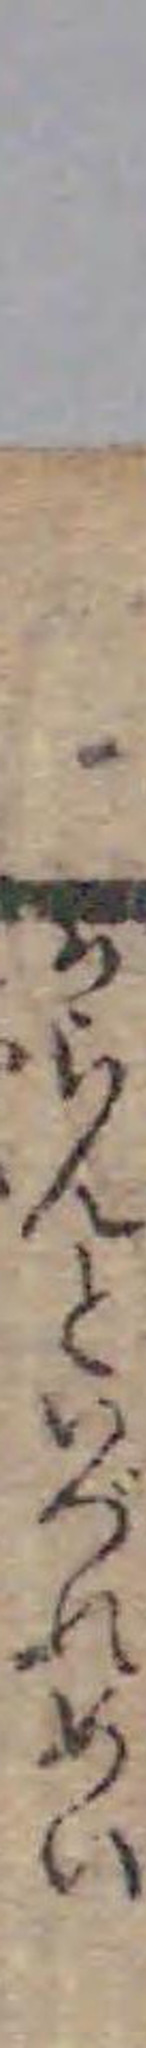からんといづれめい
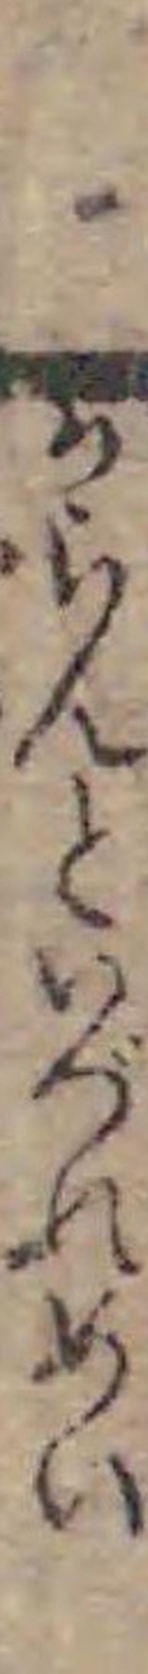からんといづれめい
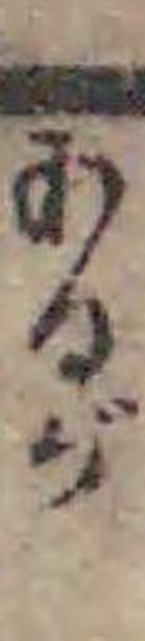あるが
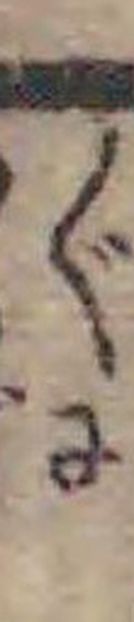〴〵に
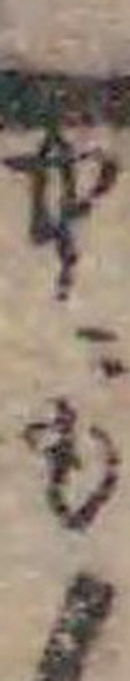中にも
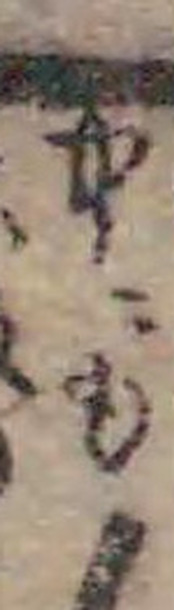中にも
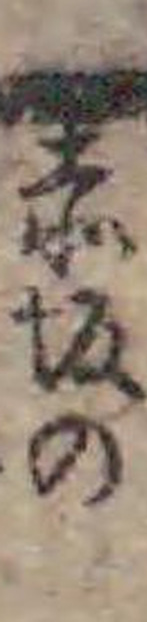赤坂の
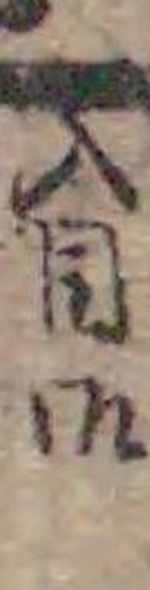入目御
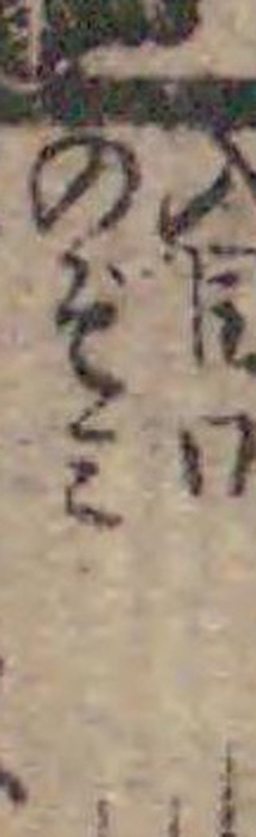のぞみ
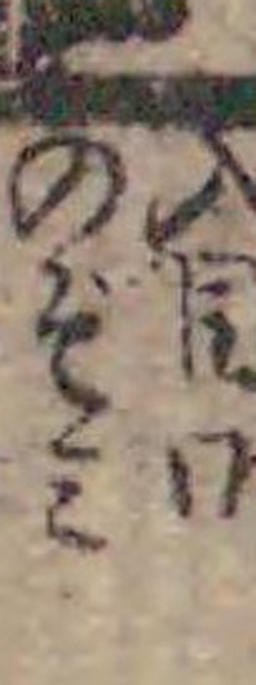のぞみ
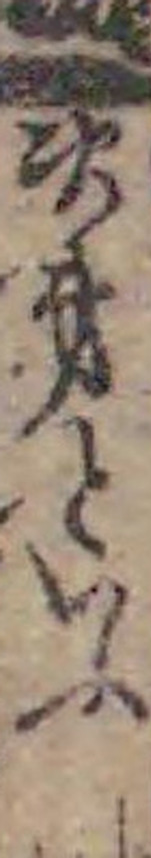次第といふ
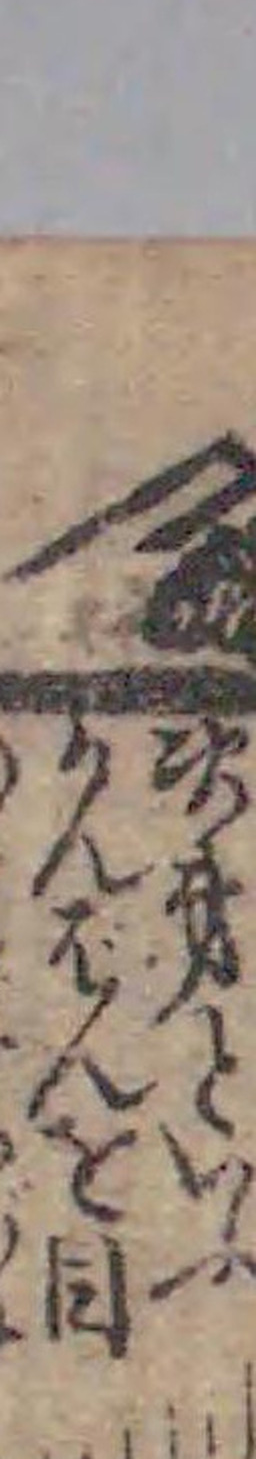かんばんを目
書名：悪七変目景清 : 2巻
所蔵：国立国会図書館 National Diet Library, JAPAN
